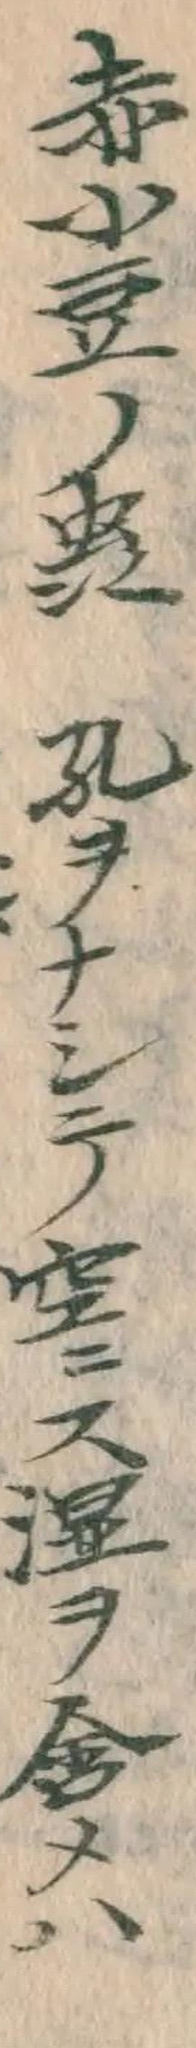赤小豆ノ虫孔ヲナシテ空ニス湿ヲ含メハ
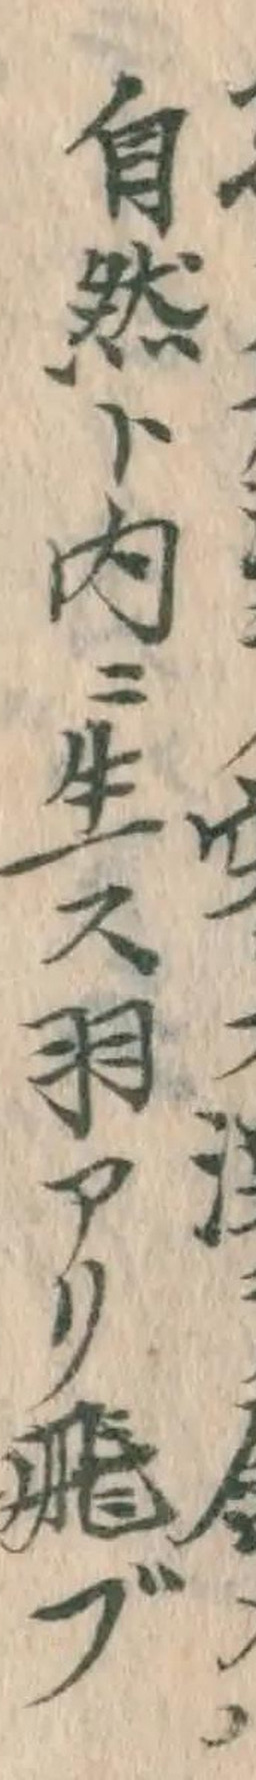自然ト内ニ生ス羽アリ飛ブ

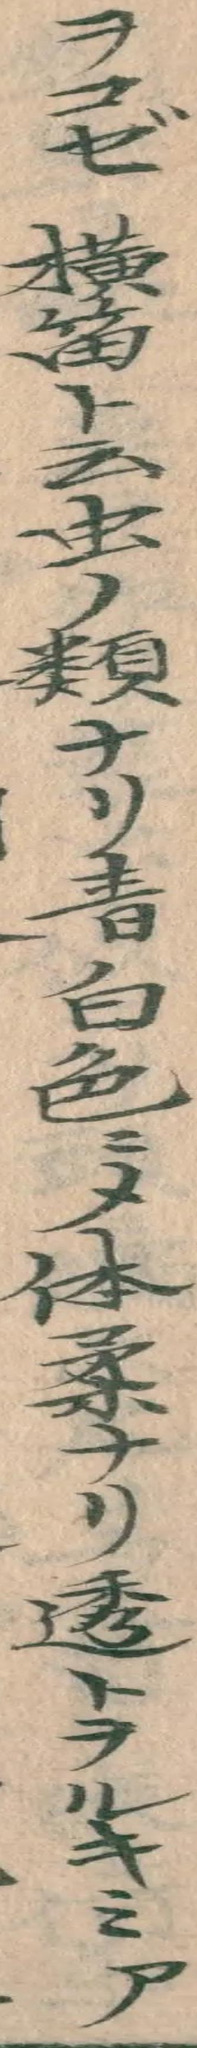ヲコゼ横笛ト云虫ノ類ナリ青白色ニシテ体柔ナリ透トヲルキミア
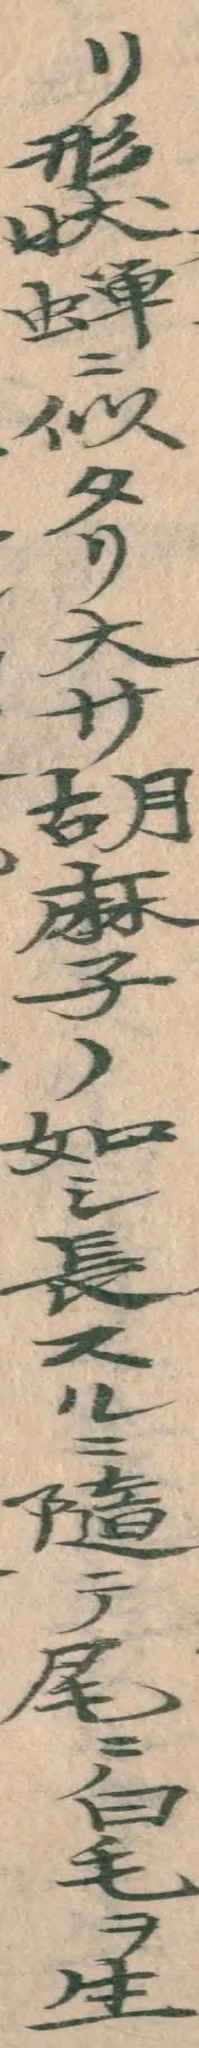リ形状蝉ニ似タリ大サ胡麻子ノ如シ長スルニ随テ尾ニ白毛ヲ生
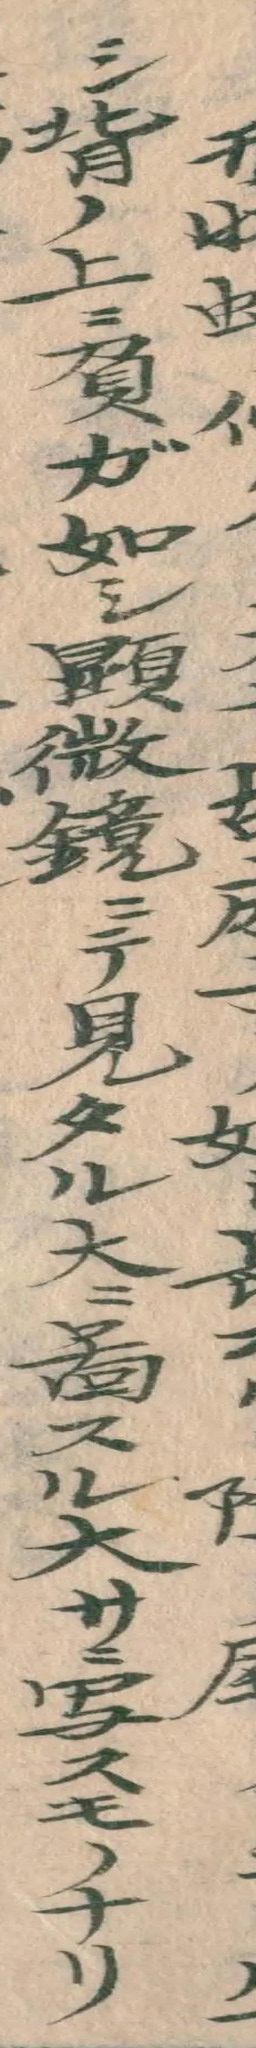シ背ノ上ニ負ガ如シ顕微鏡ニテ見タル大ニ図スル大サニ写スモノナリ
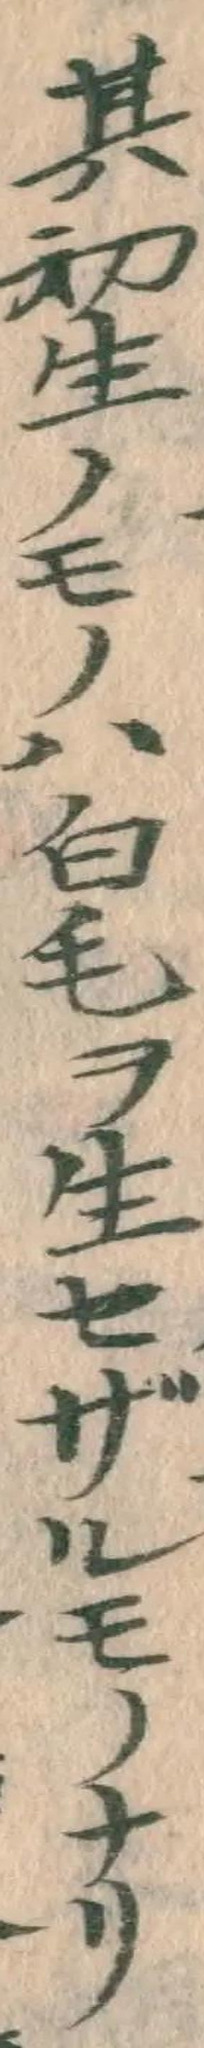其初生ノモノハ白毛ヲ生セザルモノナリ
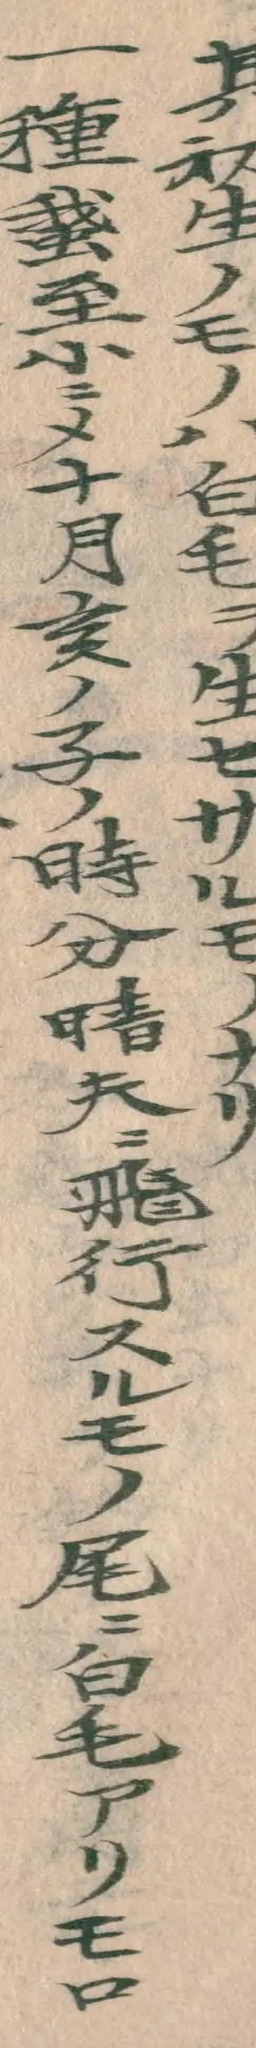一種蛾至小ニシテ十月亥ノ子ノ時分晴天ニ飛行スルモノ尾ニ白毛アリモロ
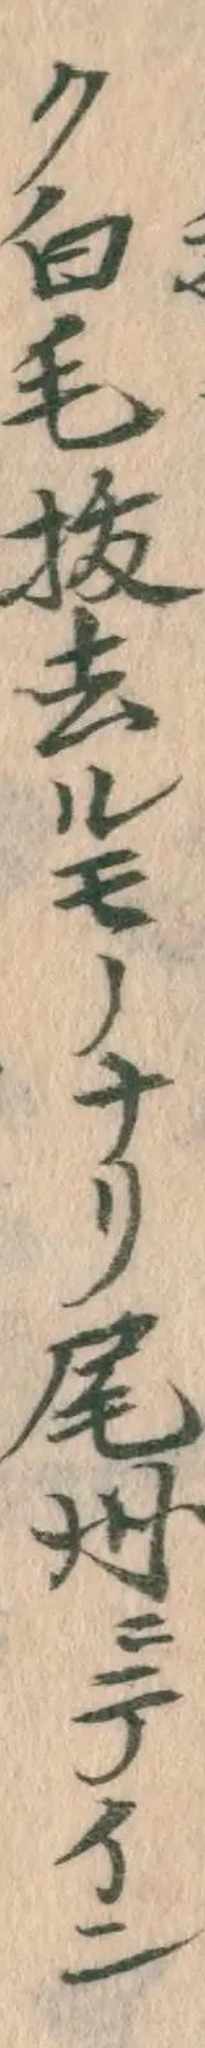ク白毛抜去ルモノナリ尾州ニテイン
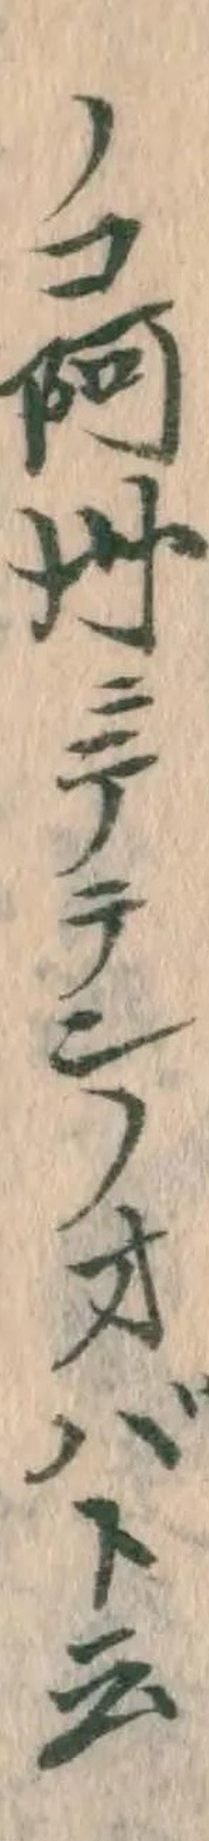ノコ阿州ニテテンノオバト云
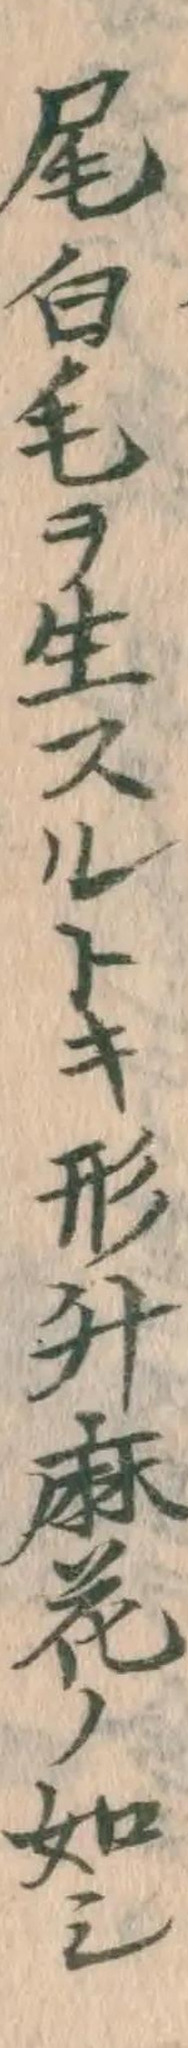尾白毛ヲ生スルトキ形升麻花ノ如シ
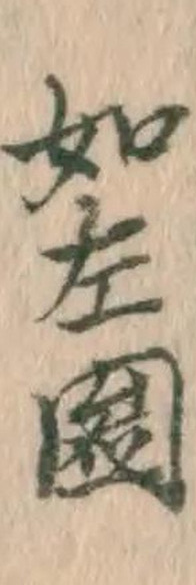如左図
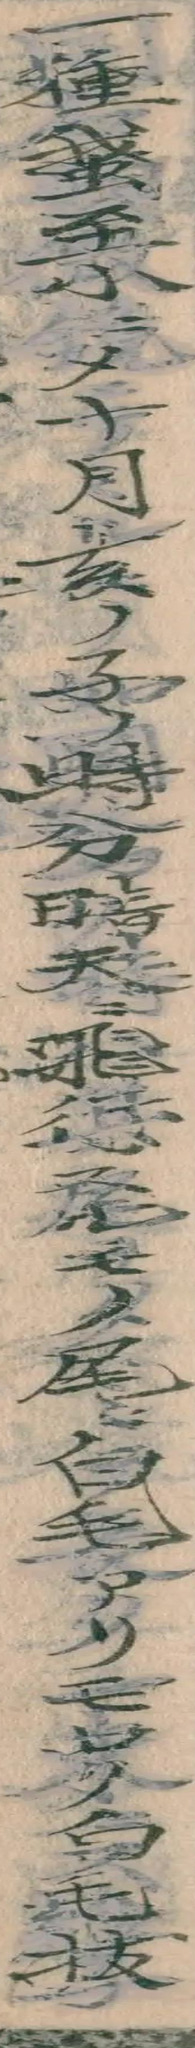一種蛾至小ニシテ十月亥ノ子ノ時分晴天ニ飛行スルモノ尾ニ白毛アリモロ
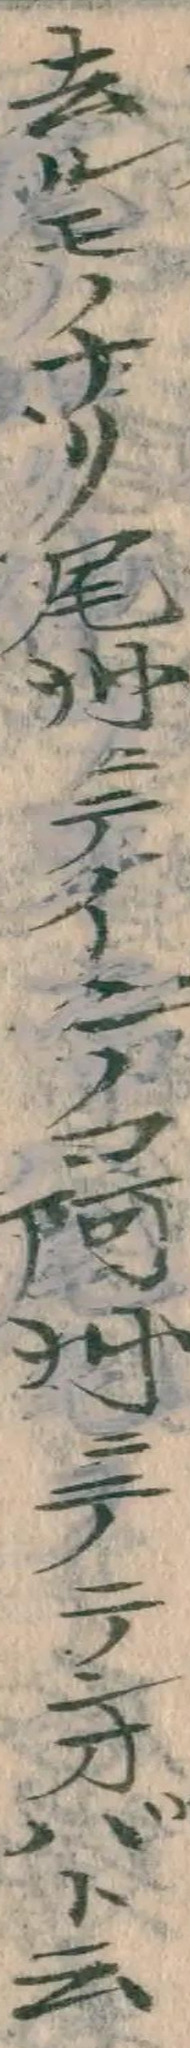去ルモノナリ尾州ニテインノコ阿州ニテテンオバト云
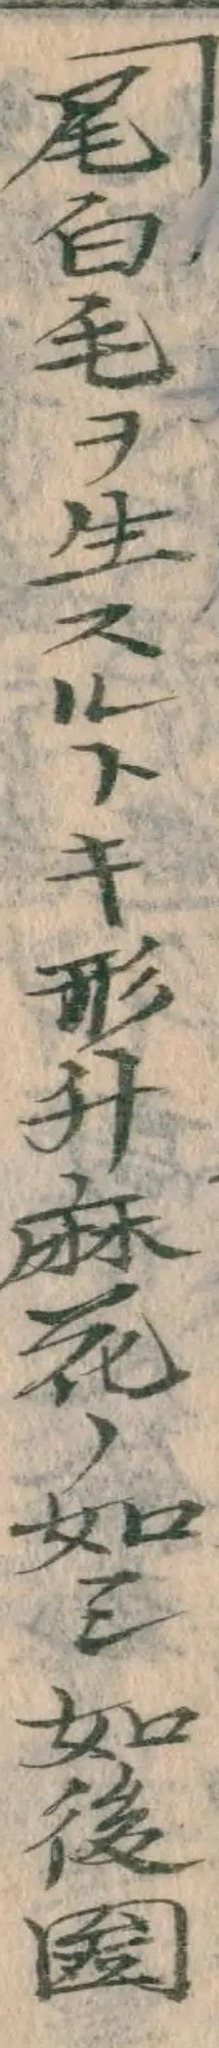「尾白毛ヲ生スルトキ形升麻花ノ如シ如後図

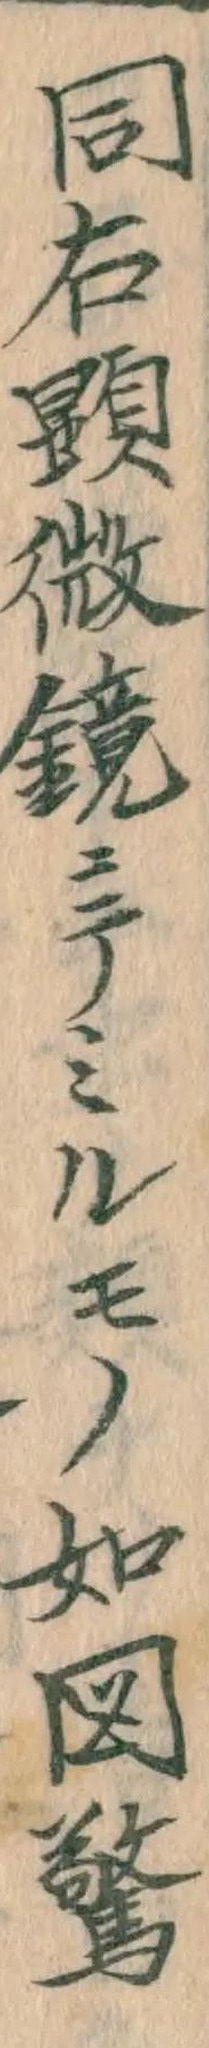同右顕微鏡ニテミルモノ如図驚
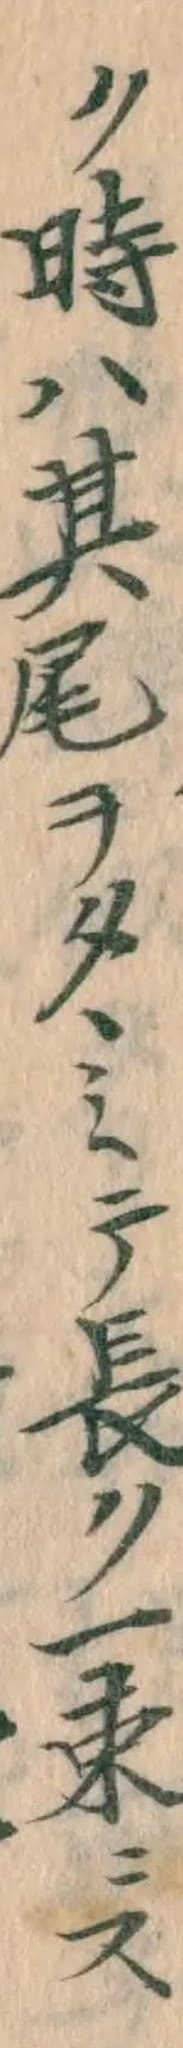ク時ハ其尾ヲタヽミテ長ク一束ニス
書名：千蟲譜 3巻. [3]
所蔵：国立国会図書館 National Diet Library, JAPAN
